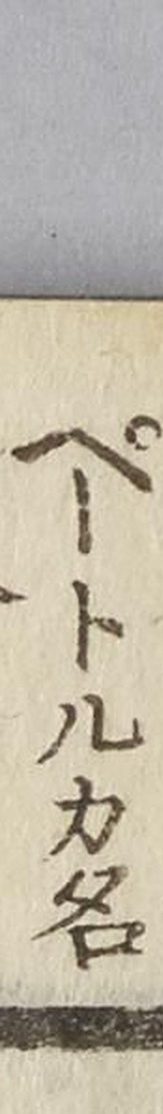ペートルカ名
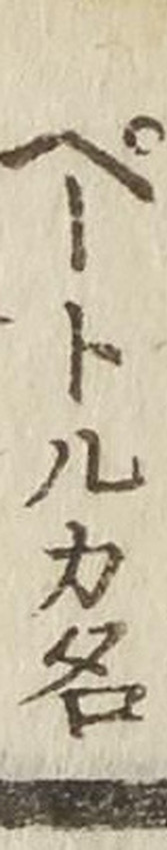ペートルカ名
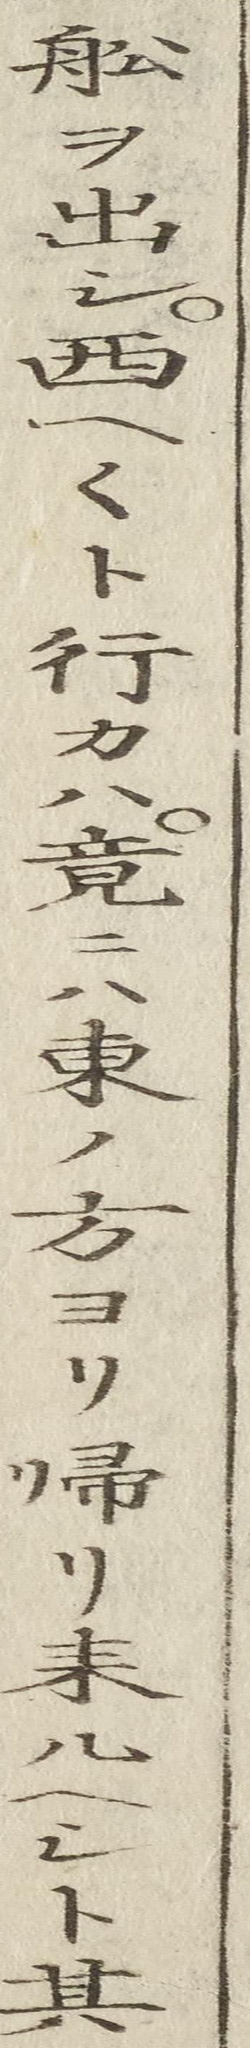舩ヲ出シ。西ヘ〳〵ト行カハ。竟ニハ東ノ方ヨリ帰リ来ルヘシト其
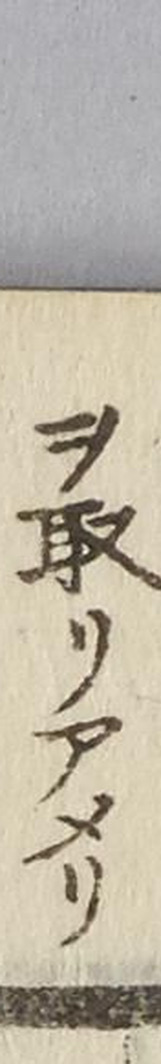ヲ取リアメリ
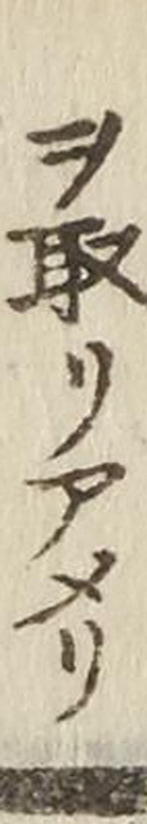ヲ取リアメリ
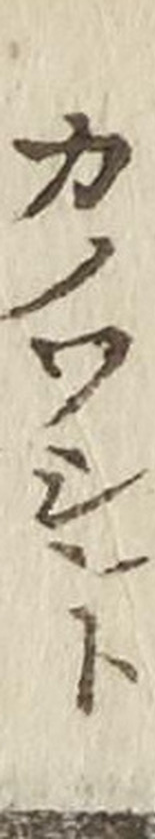カノワシント
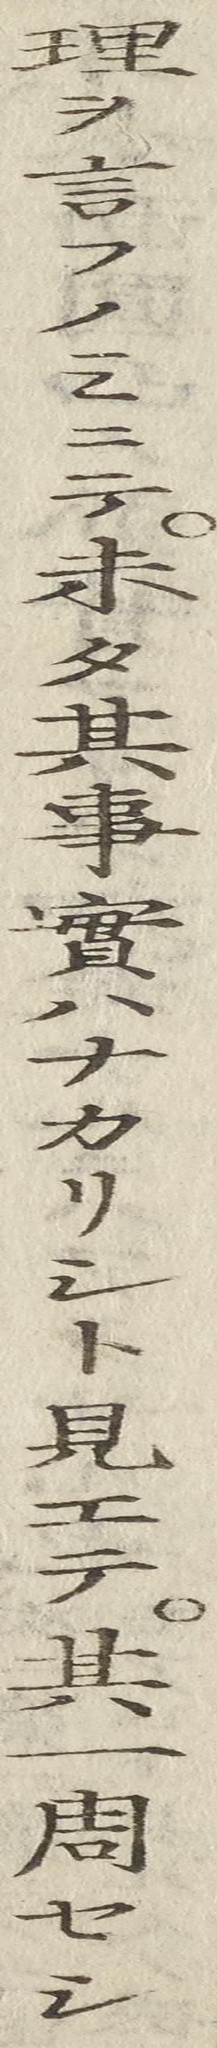理ヲ言フノミニテ。来タ其事実ハナカリシト見エテ。其一周セシ
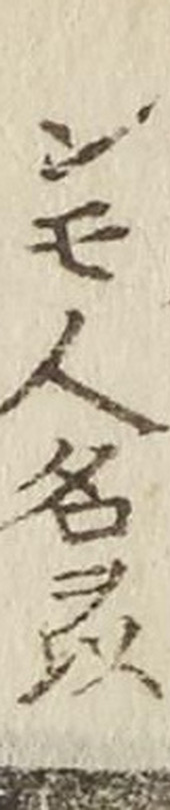ンモ人名ヲ以
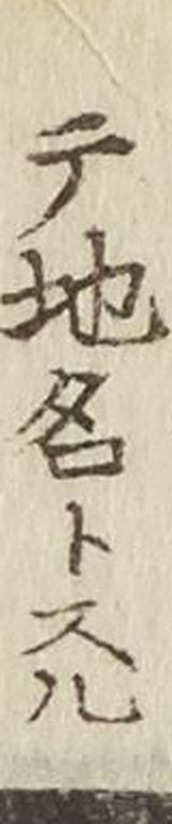テ地名トスル
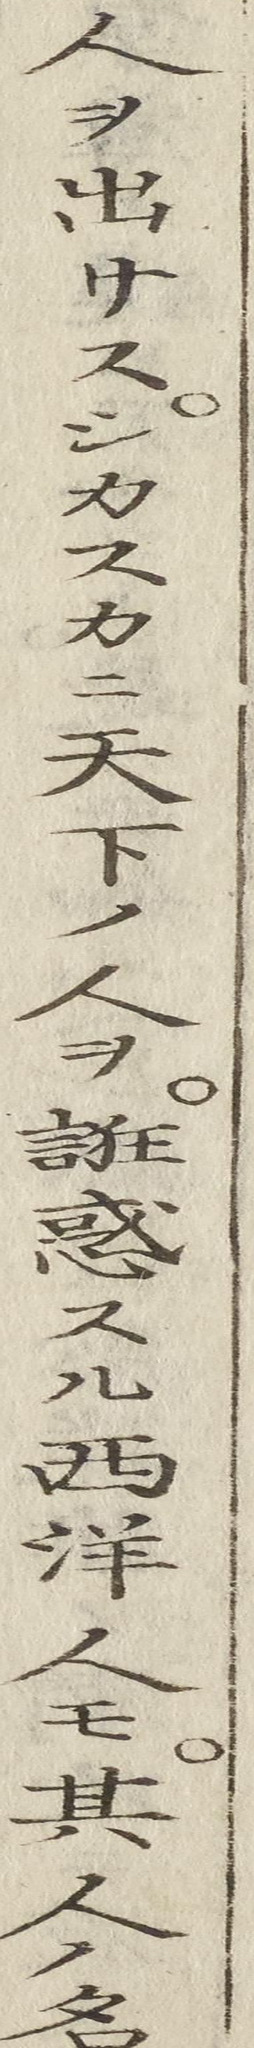人ヲ出サス。シカスカニ天下ノ人ヲ。誑惑スル西洋人モ。其人ノ名
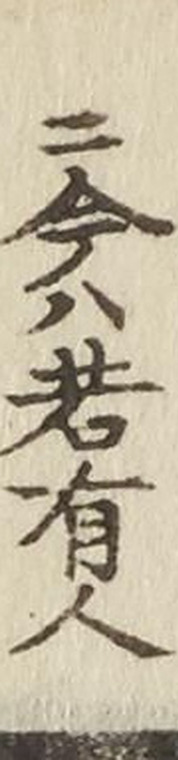ニ今ハ若有人
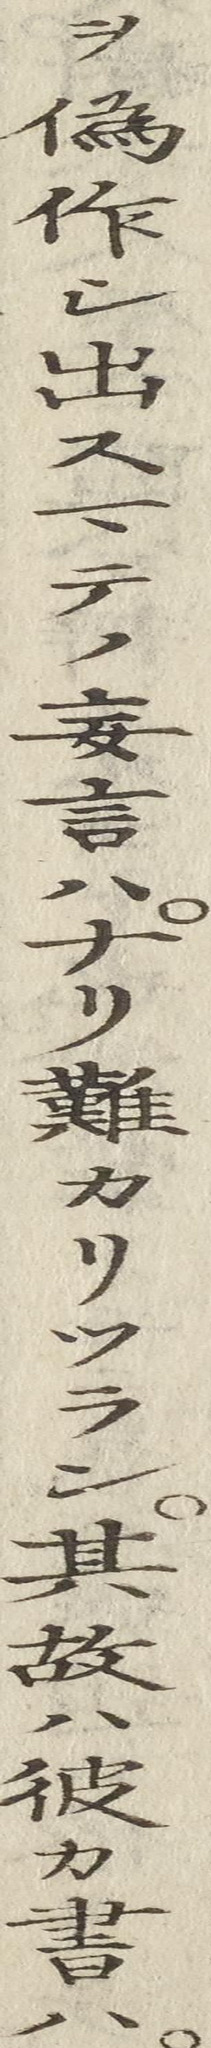ヲ偽作シ出スマテノ妄言ハ。ナリ難カリツラン。其故ハ彼カ書ハ。
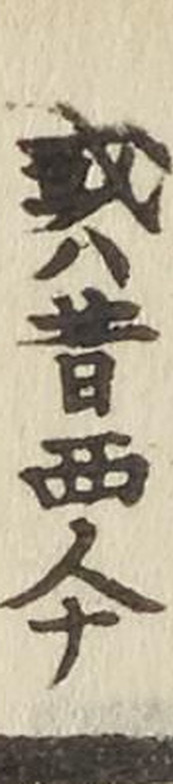或ハ昔西人ナ
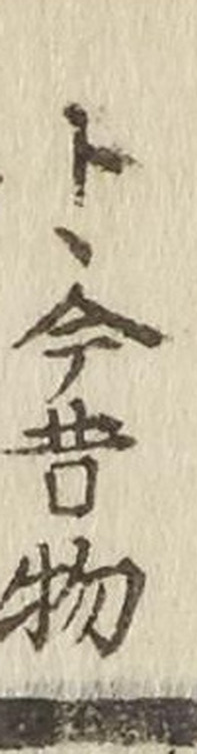トヽ今昔物
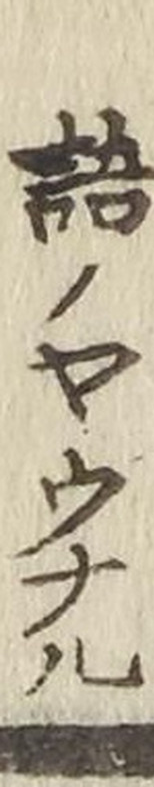語ノヤウナル
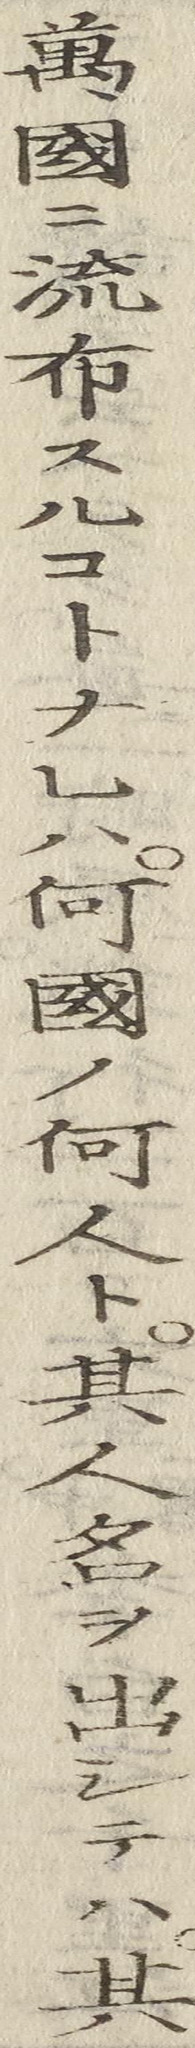万国ニ流布スルコトナレハ。何国ノ何人ト。其人名ヲ出シテハ。其
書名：護法新論　中
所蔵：東京大学地震研究所図書室 Earthquake Research Institute Library, The University of Tokyo, JAPAN
